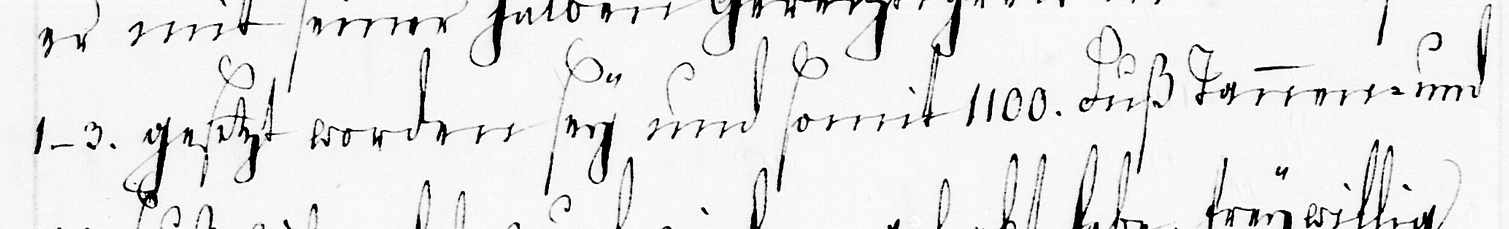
1.–3. gesetzt worden sey und somit 1100. Fuß Tannen- und
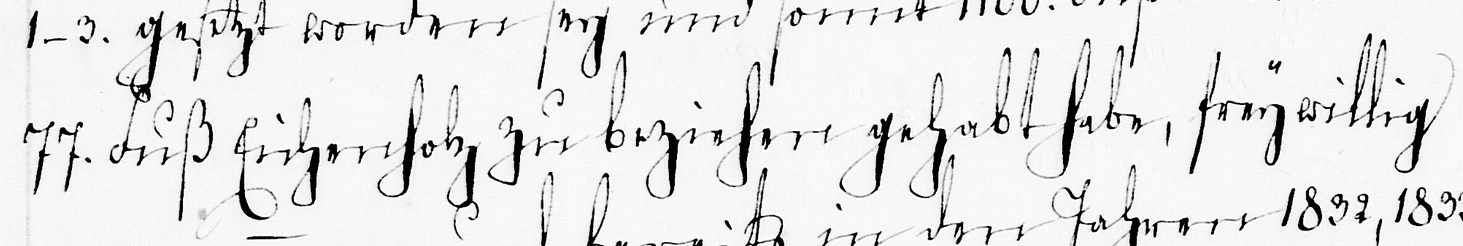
77. Fuß Eichenholz zu beziehen gehabt habe, freywillig
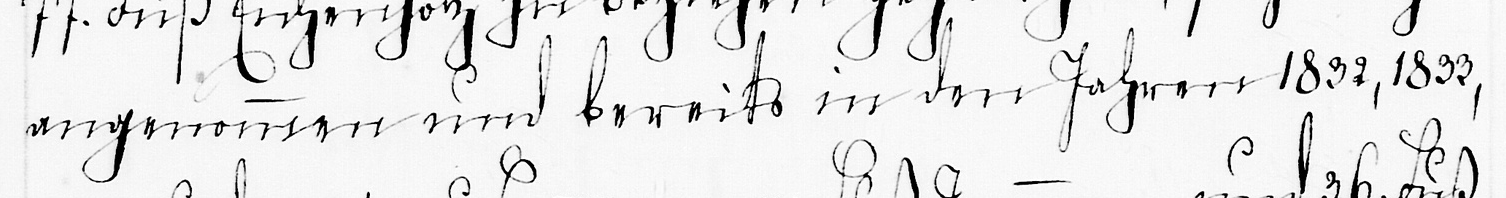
angenommen und bereits in den Jahren 1832, 1833,
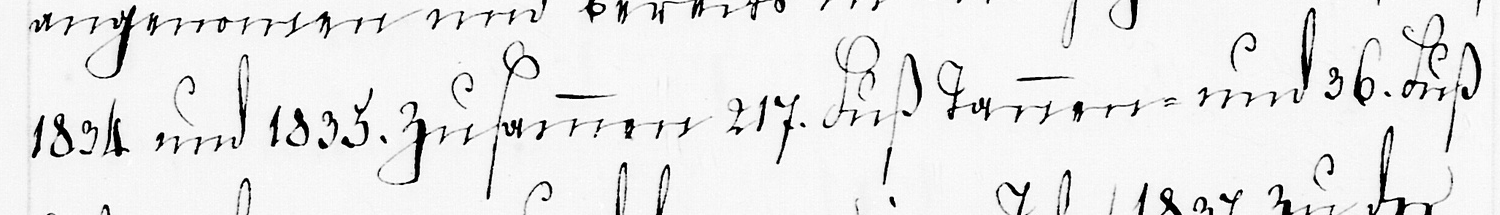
1834 und 1835. zusammen 217. Fuß Tannen- und 36. Fuß
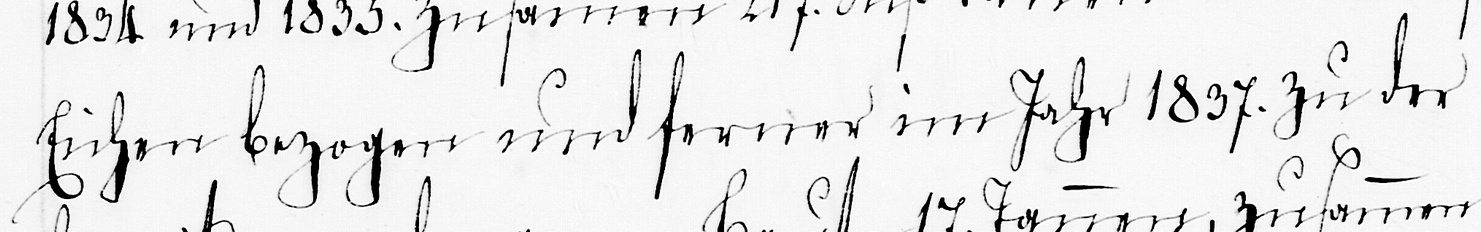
Eichen bezogen und ferner im Jahr 1837. zu der
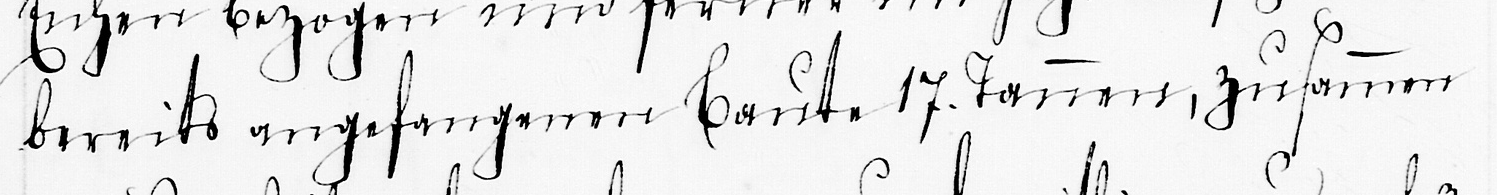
bereits angefangenen Baute 17. Tannen, zusammen
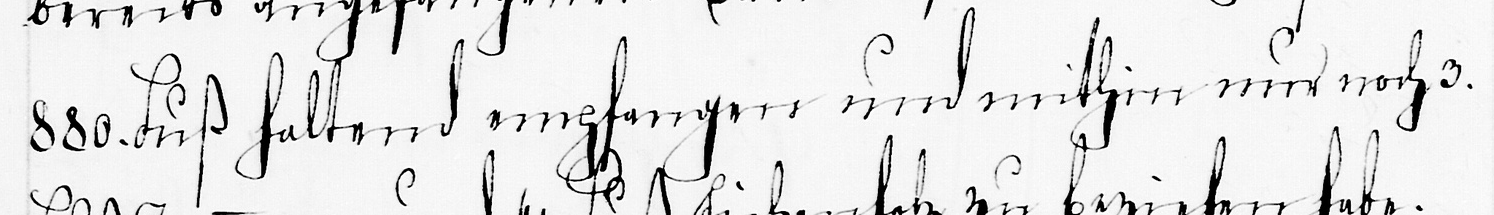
880. Fuß haltend empfangen und mithin nur noch 3.
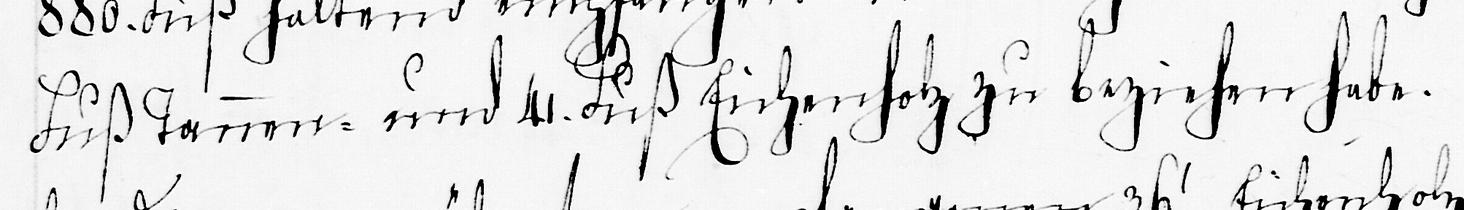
Fuß Tannen- und 41. Fuß Eichenholz zu beziehen habe.
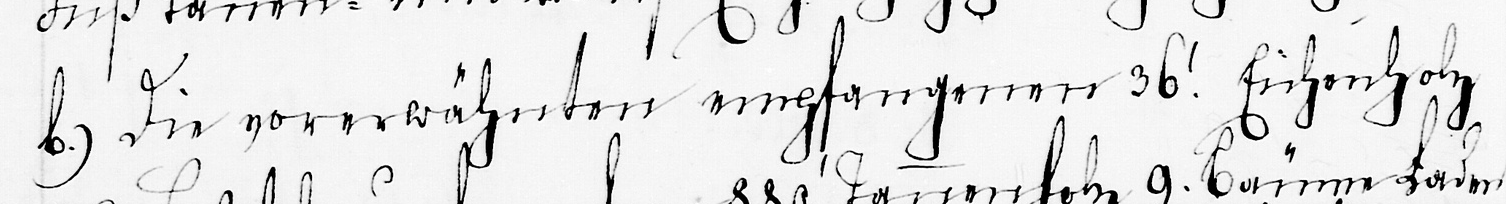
b.) Die vorerwähnten empfangenen 36.‘ Eichenholz
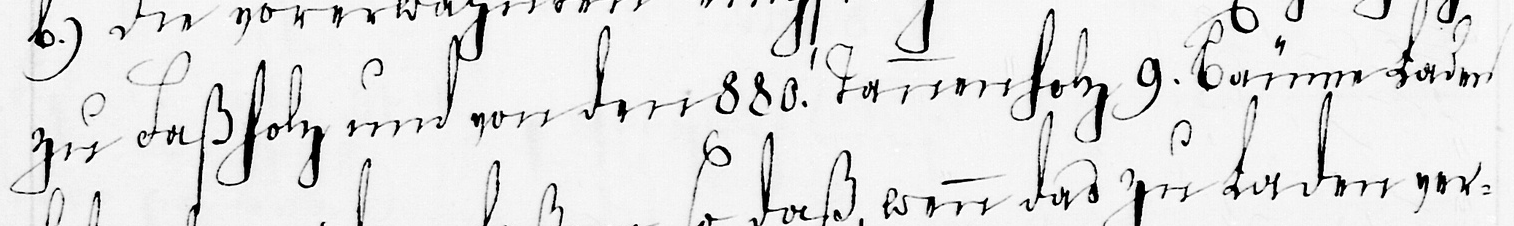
zu Faßholz und von den 880.‘ Tannenholz 9. Bäume Laden
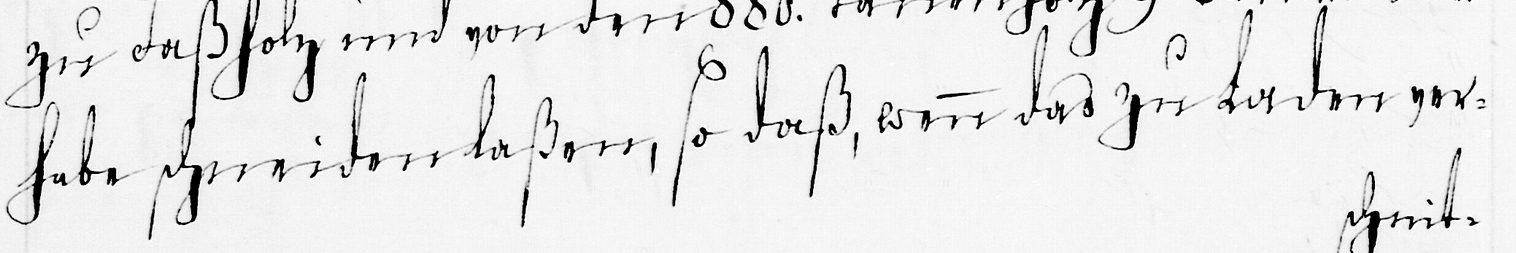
habe schneiden laßen, so daß, wenn das zu Laden ver-
